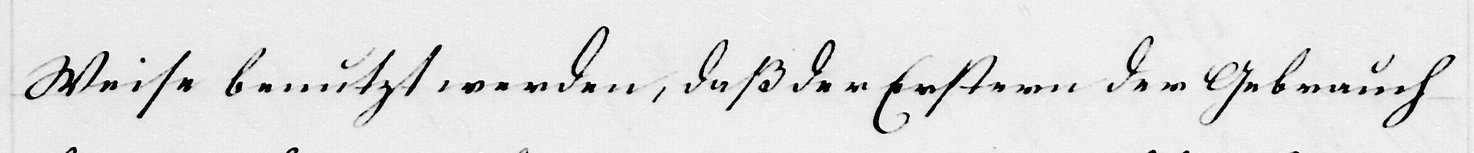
Weise benutzt werden, daß der Erstern der Gebrauch
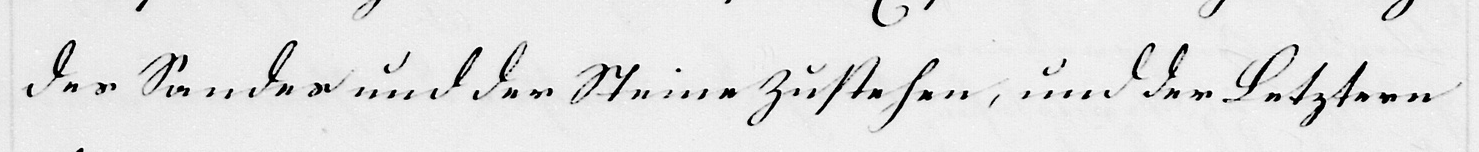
des Sandes und der Steine zustehen, und der Letztern
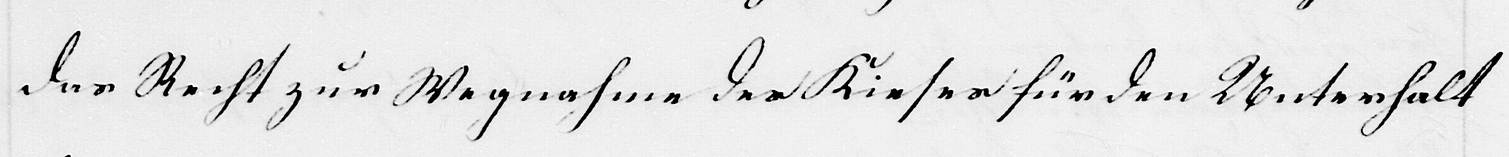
das Recht zur Wegnahme des Kieses für den Unterhalt
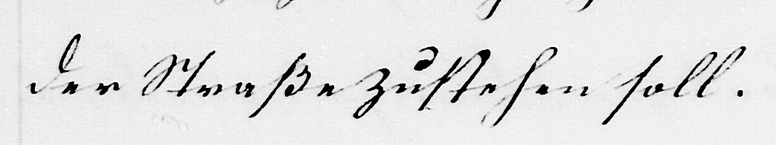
der Straße zustehen soll.
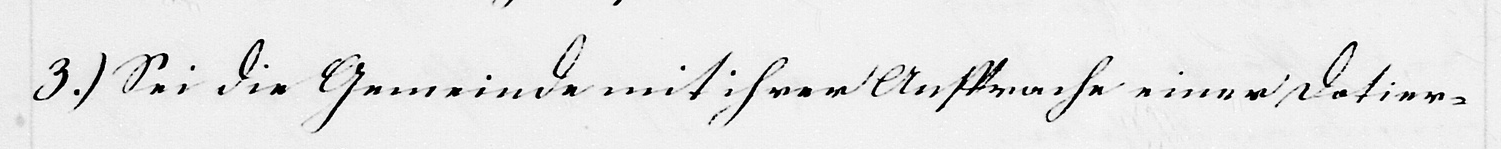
3.) Sei die Gemeinde mit ihrer Ansprache einer Dotier¬
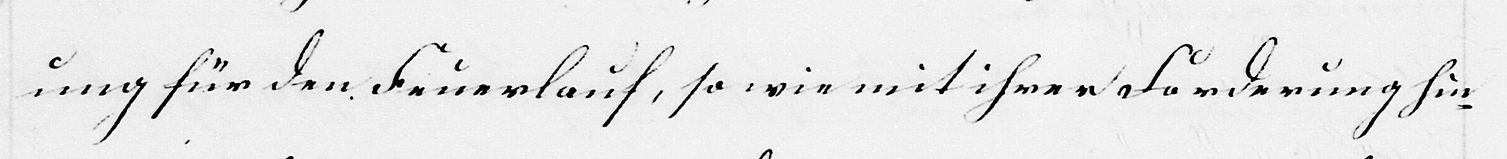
ung für den Feuerlauf, so wie mit ihrer Forderung hin¬
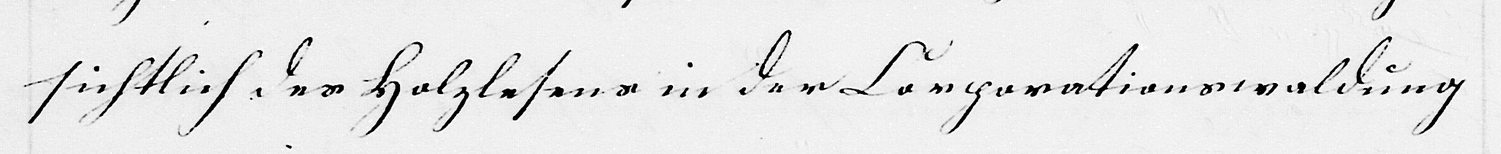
sichtlich des Holzlesens in der Corporationswaldung
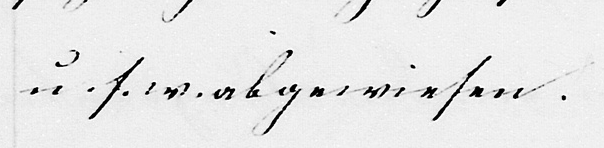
u. s. w. abgewiesen.
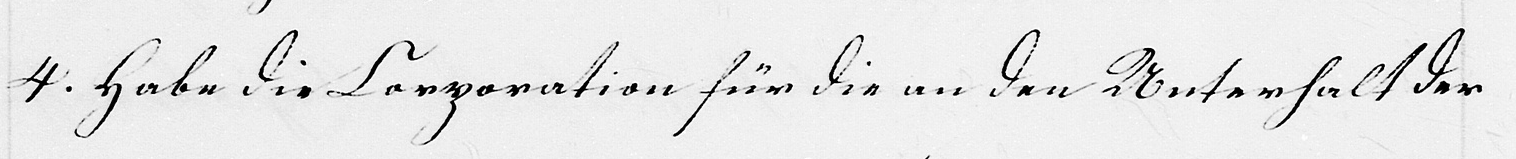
4. Habe die Corporation für die an den Unterhalt der
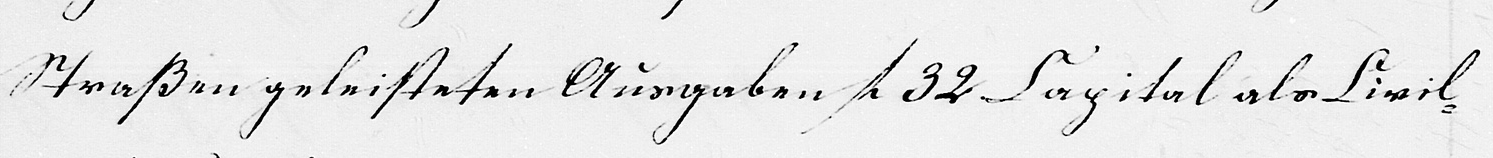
Straßen geleisteten Ausgaben fl 32 Capital als Civil¬
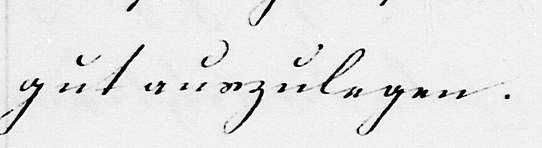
gut auszulegen.
